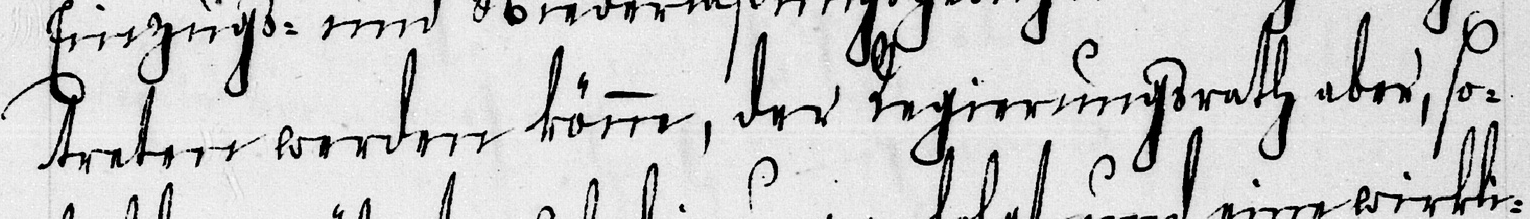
treten werden könne, der Regierungsrath aber, so¬
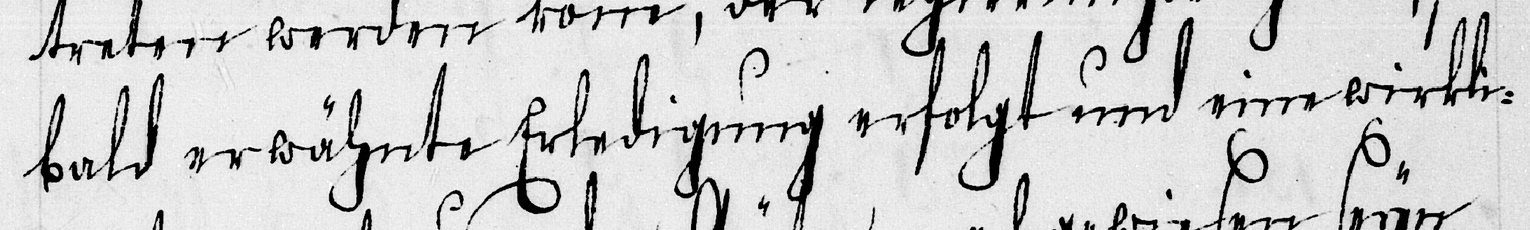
bald erwähnte Erledigung erfolgt und eine wirkli¬
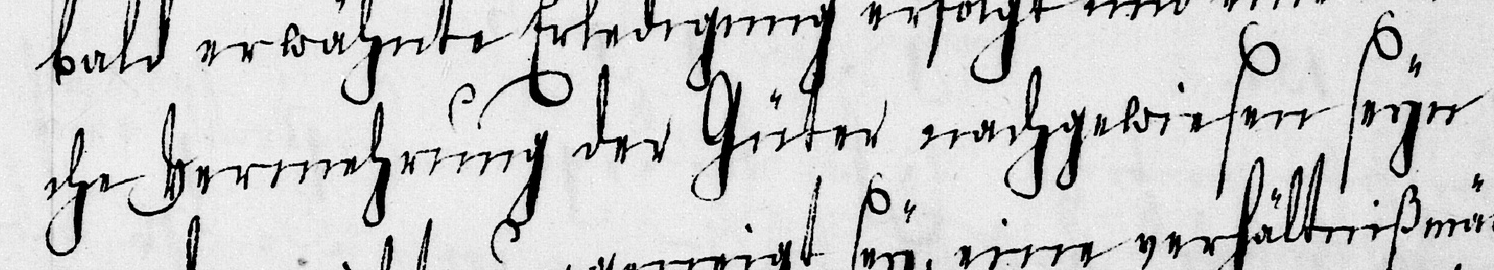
che Vermehrung der Güter nachgewiesen seyn
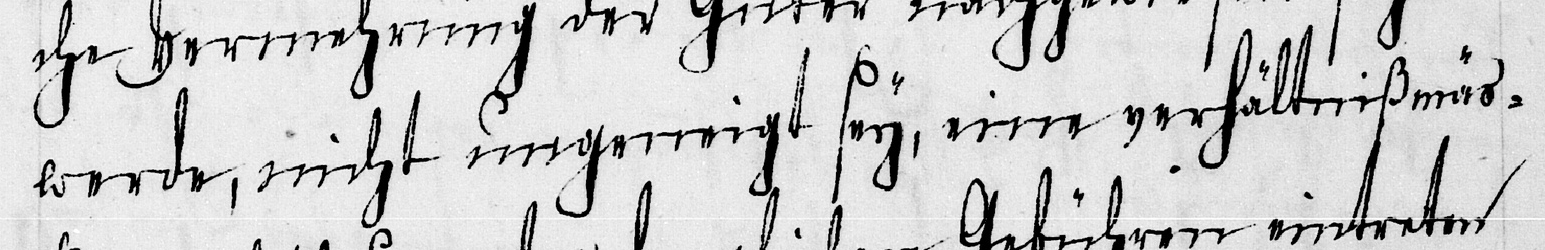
werde, nicht ungeneigt sey, eine verhältnißmäß¬
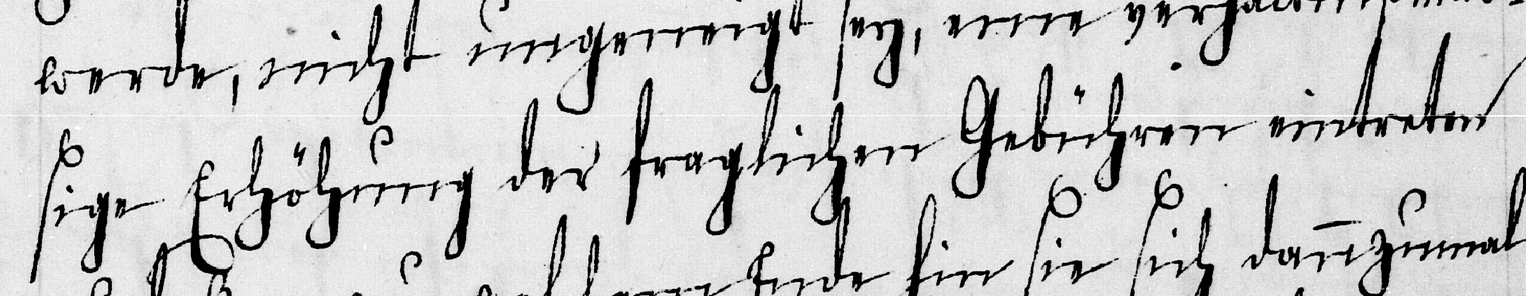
ige Erhöhung der fraglichen Gebühren eintreten
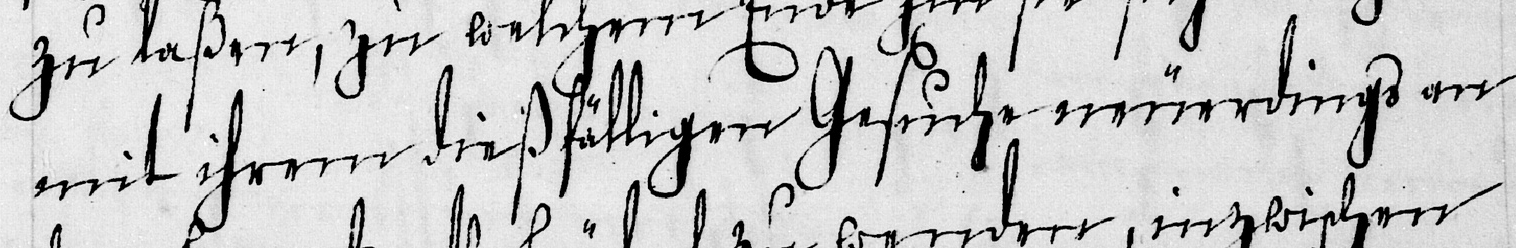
mit ihrem dießfälligen Gesuche neuerdings an
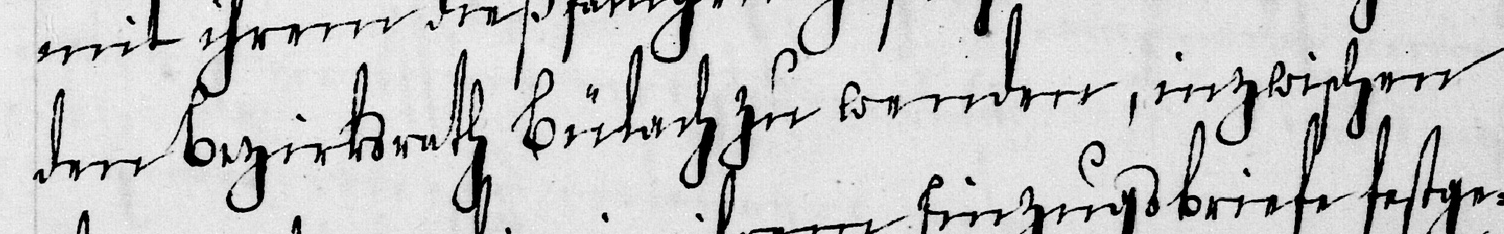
den Bezirksrath Bülach zu wenden, inzwischen
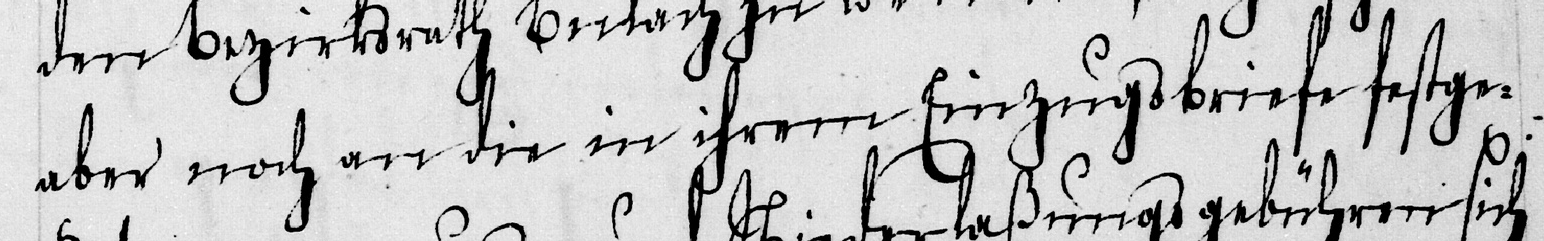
aber noch an die in ihrem Einzugsbriefe festge¬
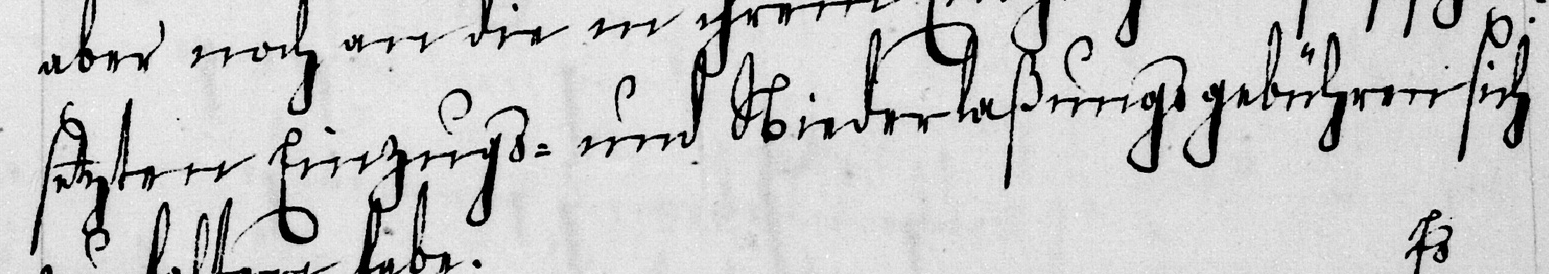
setzten Einzugs- und Niederlaßungsgebühren sich
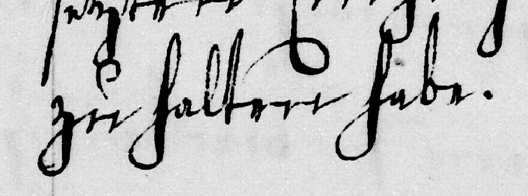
zu halten habe.
